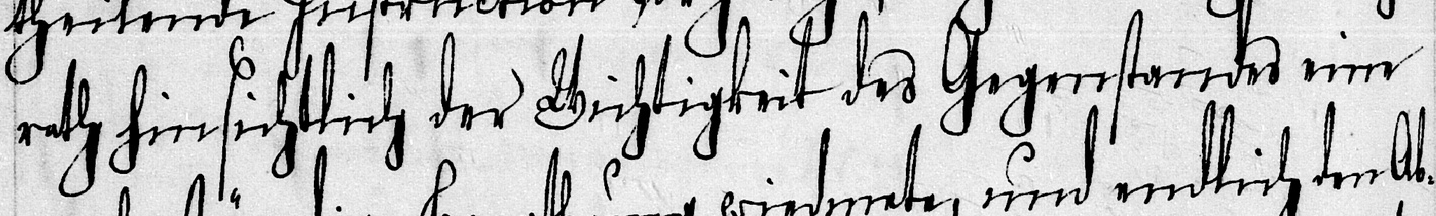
rath hinsichtlich der Wichtigkeit des Gegenstandes eine
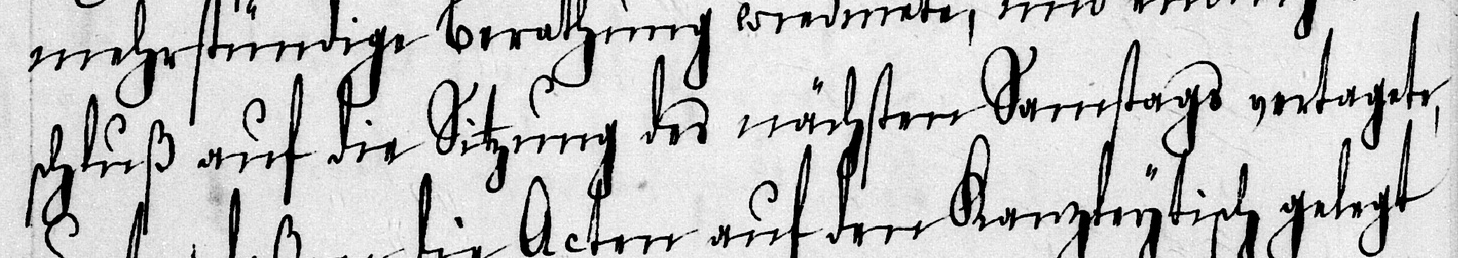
schluß auf die Sitzung des nächsten Samstags vertagete,
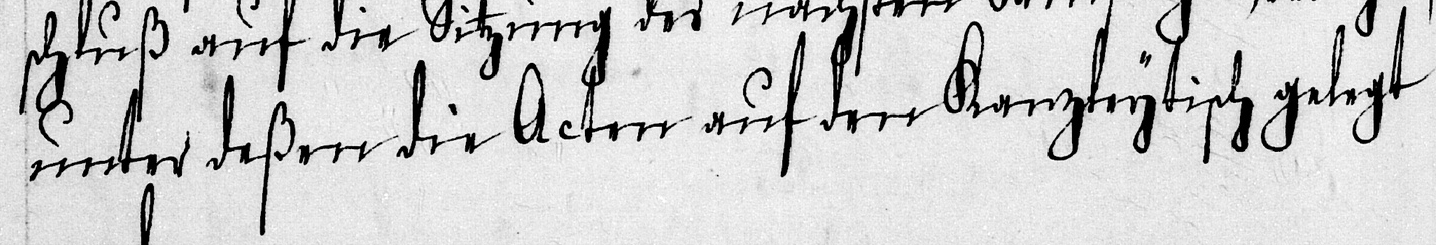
unter deßen die Acten auf den Kanzleytisch gelegt
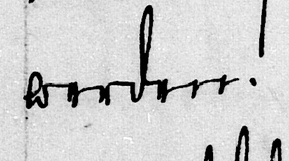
werden.
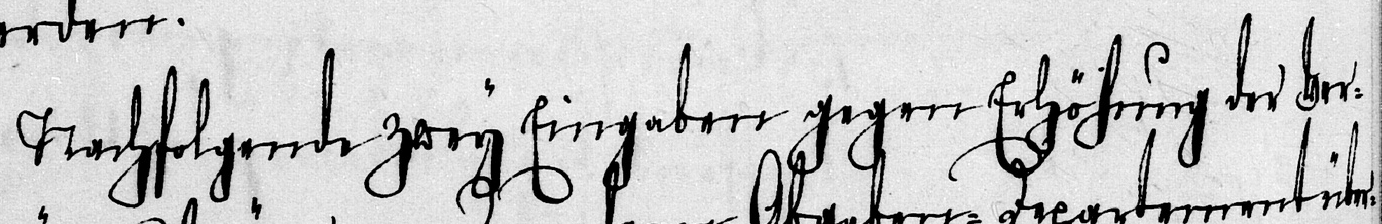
Nachfolgende zwey Eingaben gegen Erhöhung der Ve¬
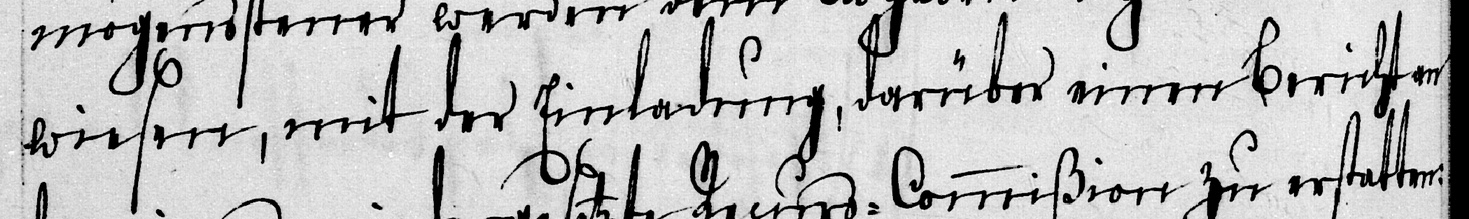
wiesen, mit der Einladung, darüber einen Bericht an
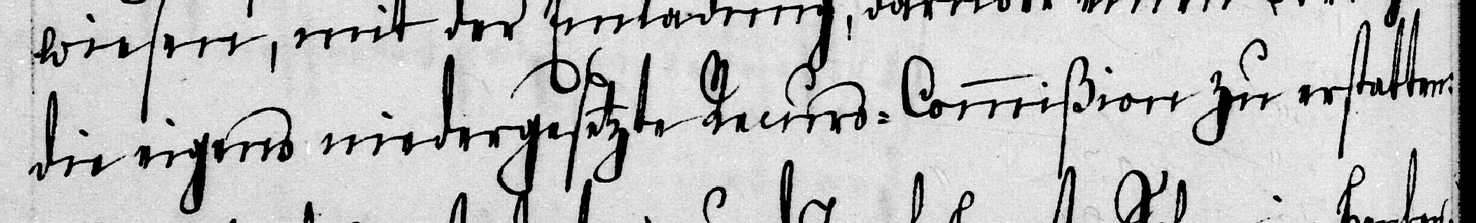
die eigens niedergesetzte Recurs-Commißion zu erstatte¬
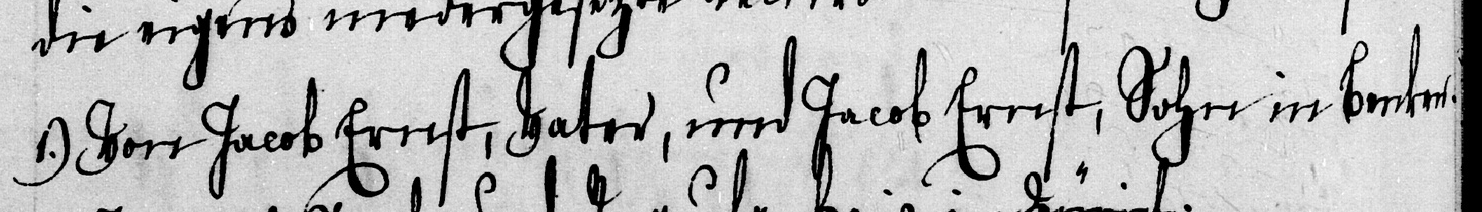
1.) Von Jacob Ernst, Vater, und Jacob Ernst, Sohn in Benken.
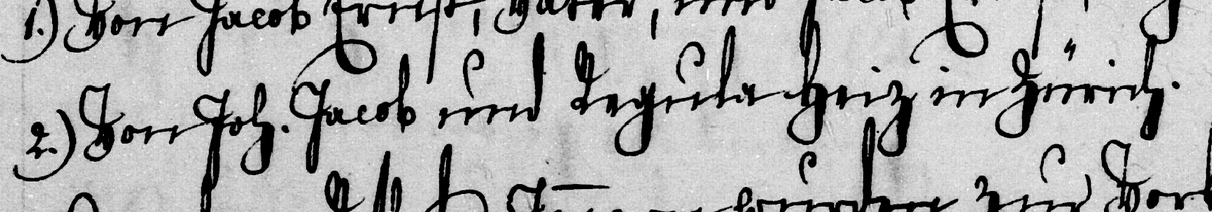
2.) Von Joh. Jacob und Regula Heiz in Zürich.
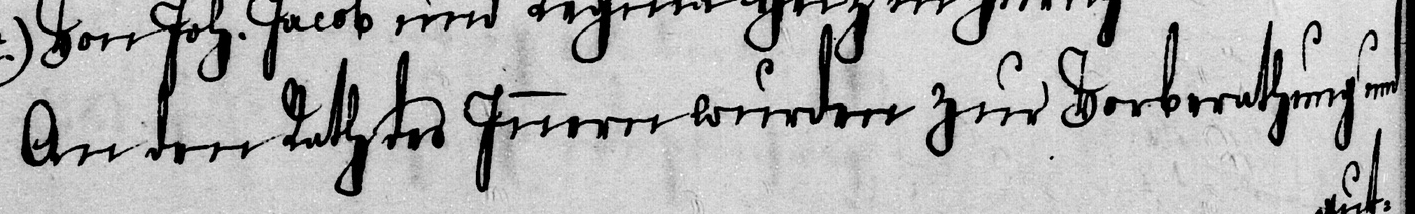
An den Rath des Innern wurden zur Vorberathung und
